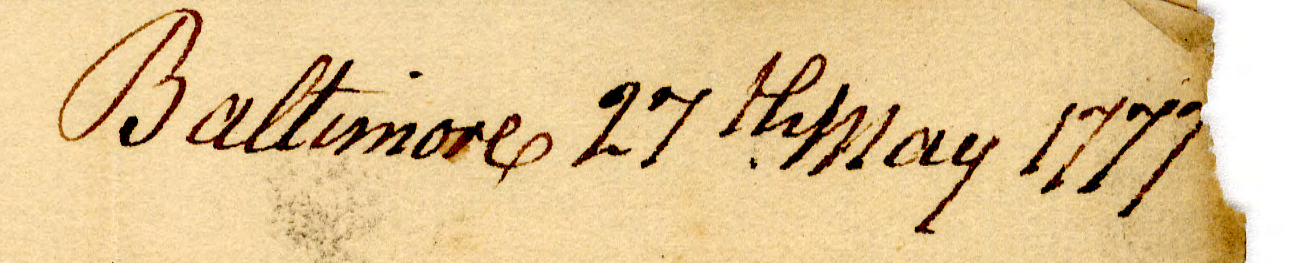Baltimore 27^th. May 1777
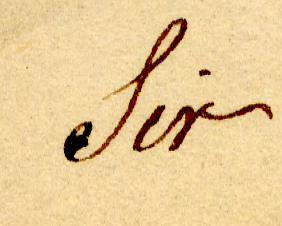Sir
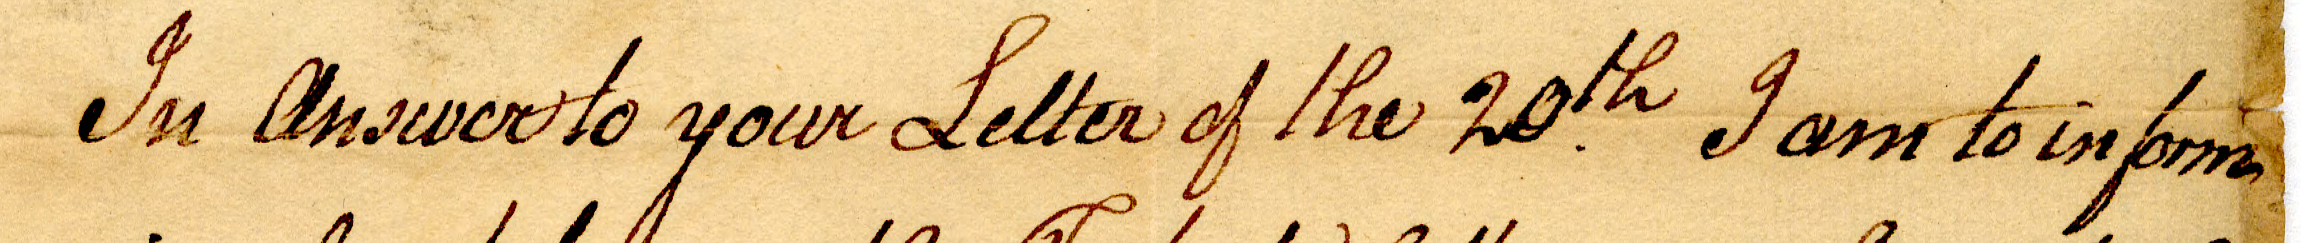In Answer your Letter of the 20^th. I am to inform
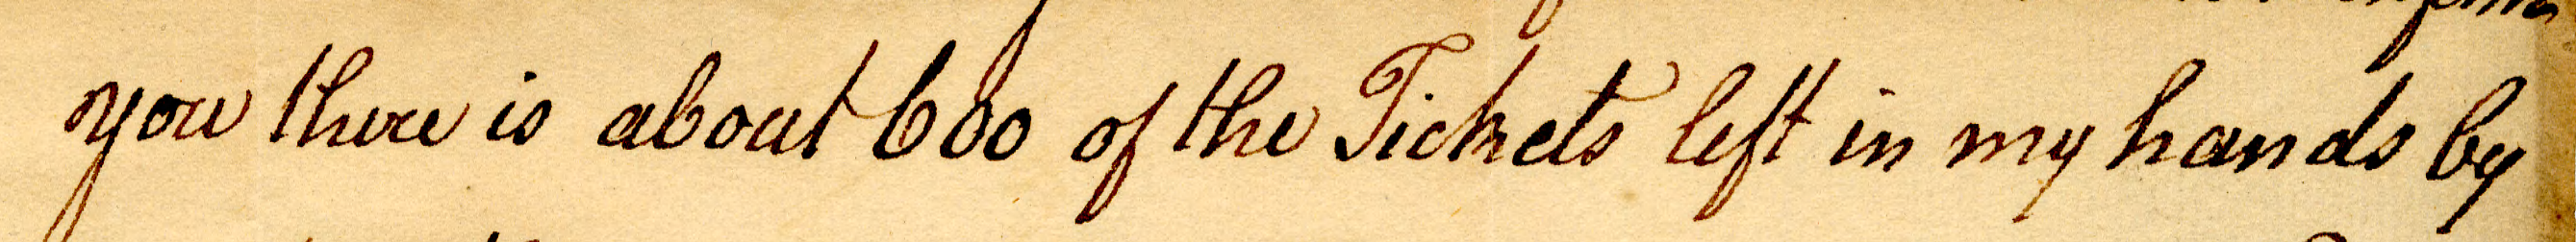you there is about 600 of the Tickets left in my hands by
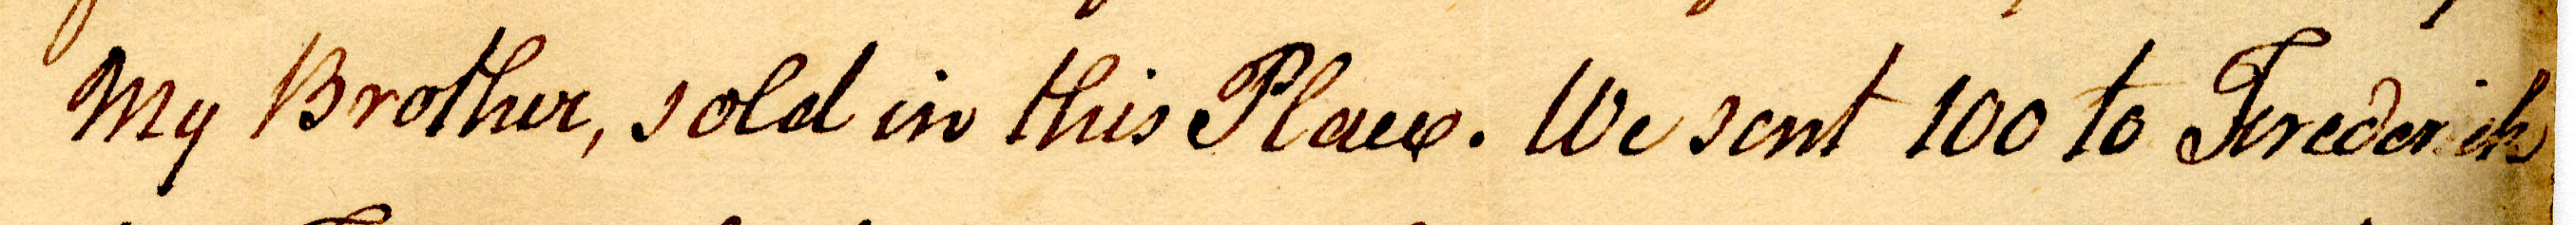my Brother, sold in this Place. We sent 100 to Frederick
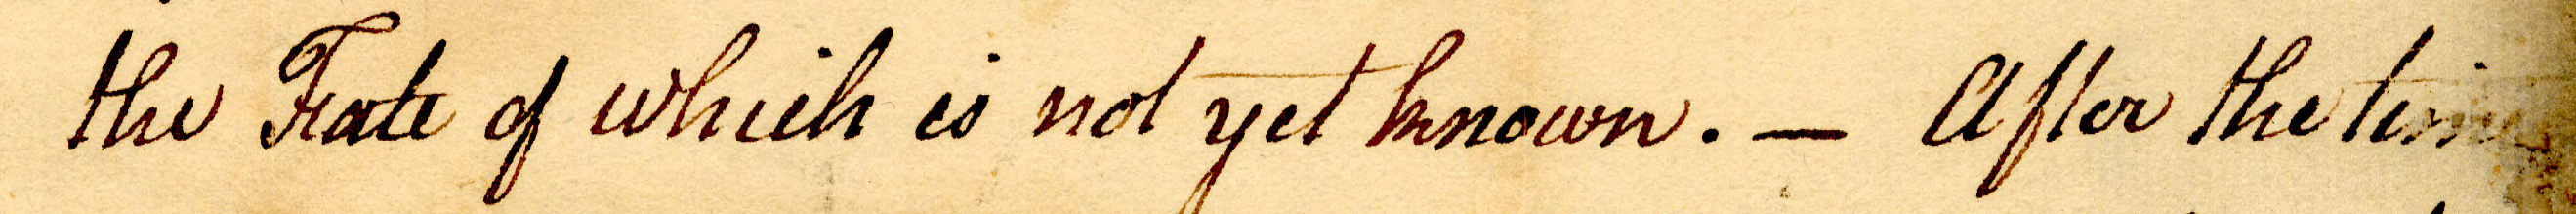the Fate of which is not yet known.- After the time
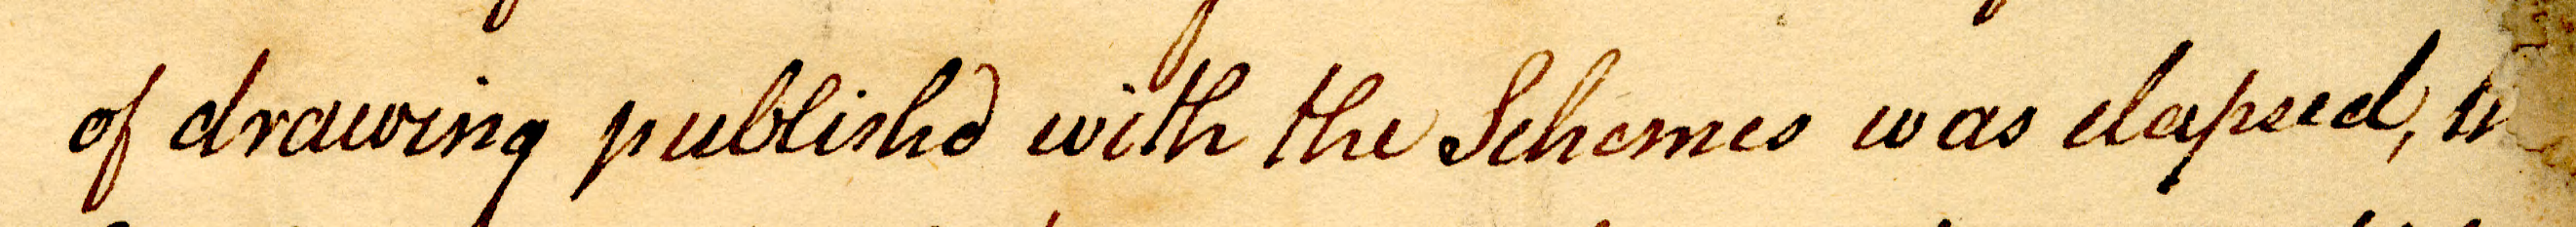of drawing published with the Schemes was elapsed, th
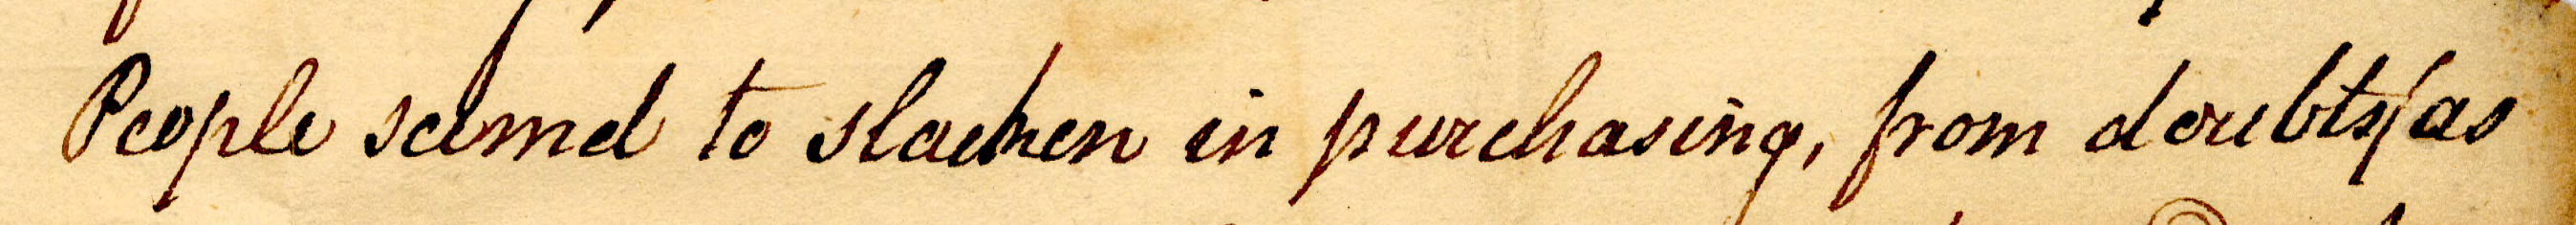People seemd to slacken in purchasing, from doubts (as
